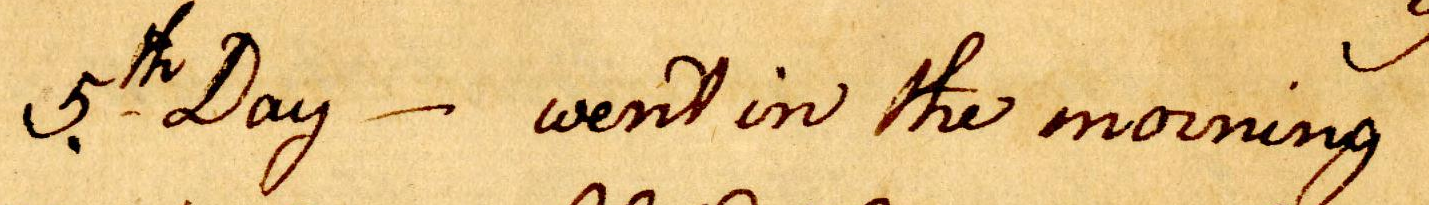5^th Day- went in the morning
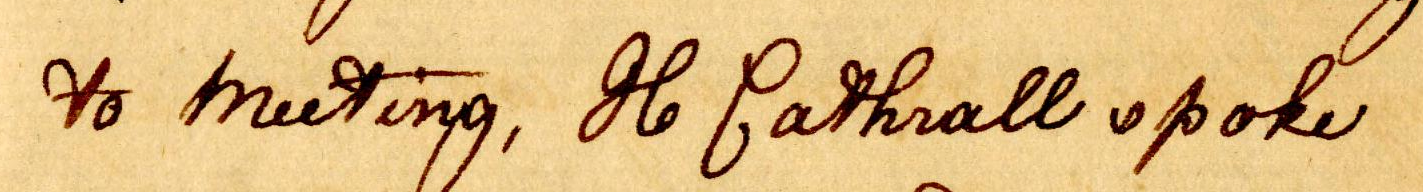to Meeting, H Cathrall spoke
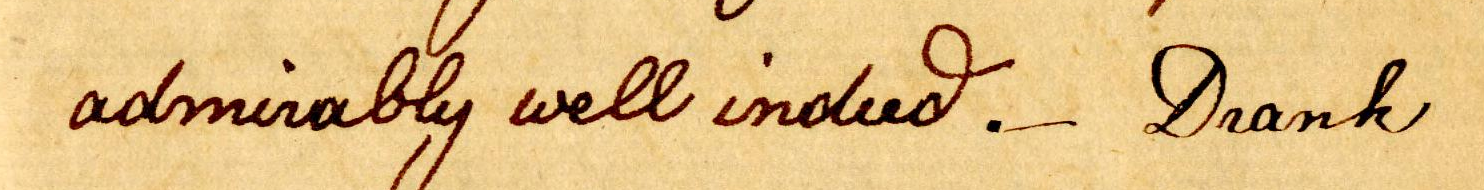admirably well indeed.- Drank
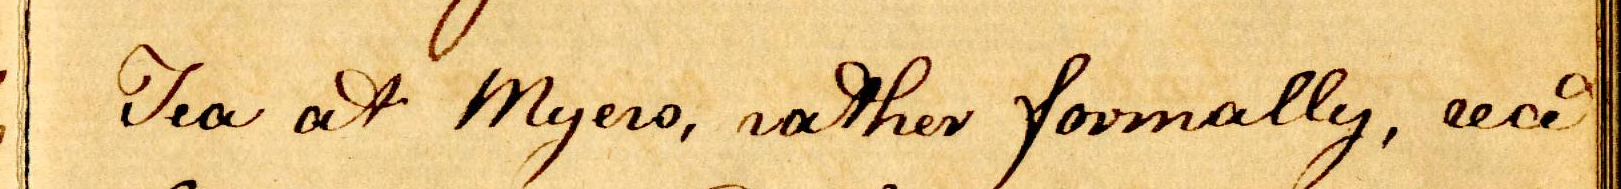Tea at Myers, rather formally, recd
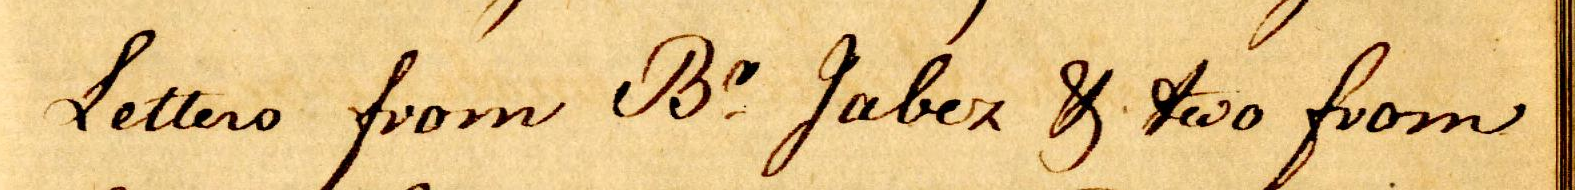Letters from B^r Jabez & two from
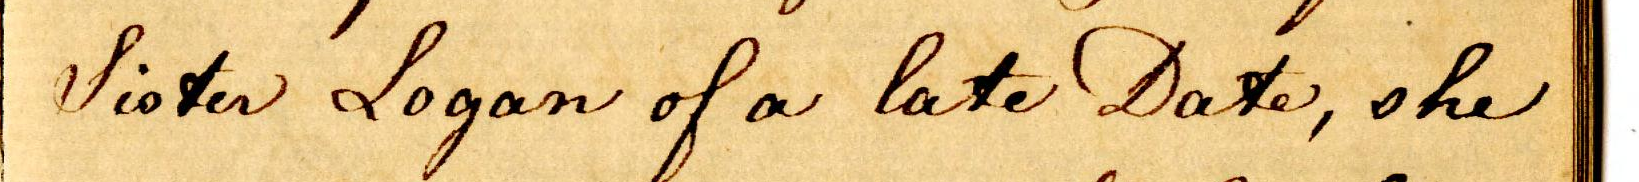Sister Logan of a late Date, she
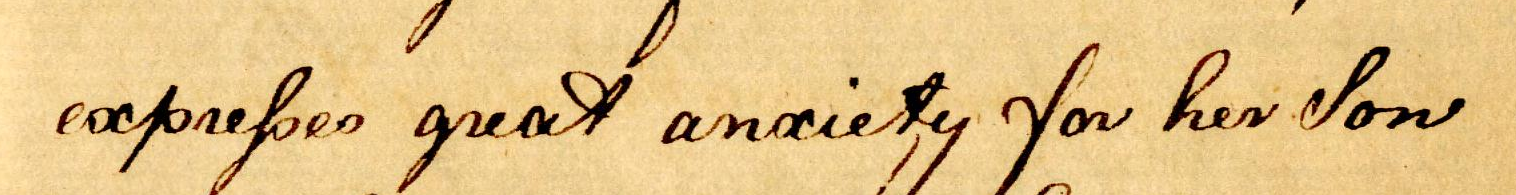expresses great anxiety for her Sons
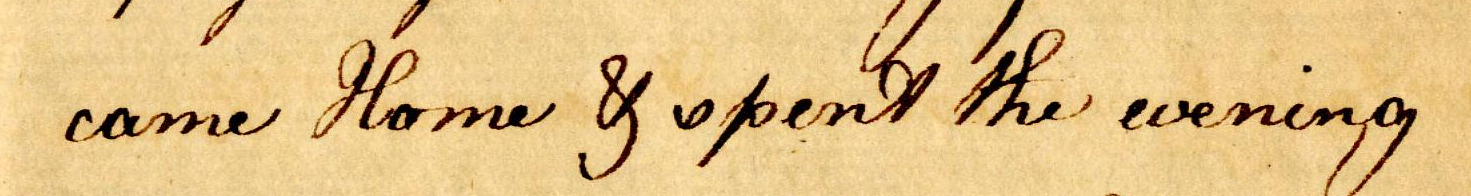came Home & spent the evening
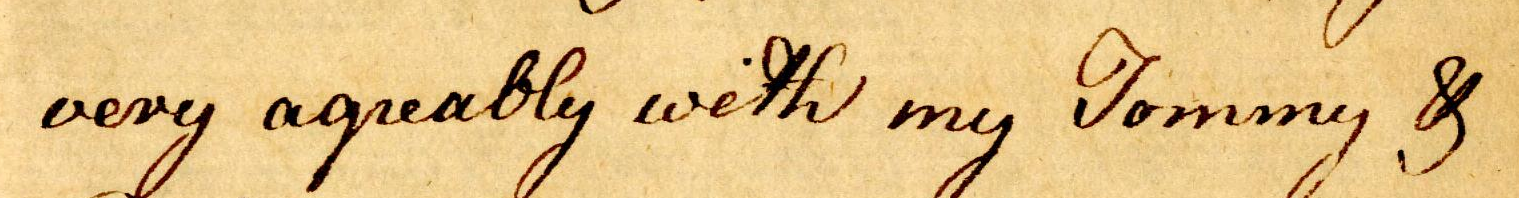very agreably with my Tommy &
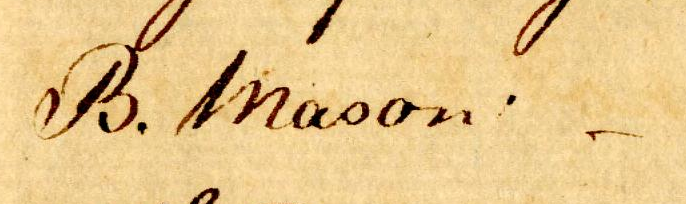B. Mason -
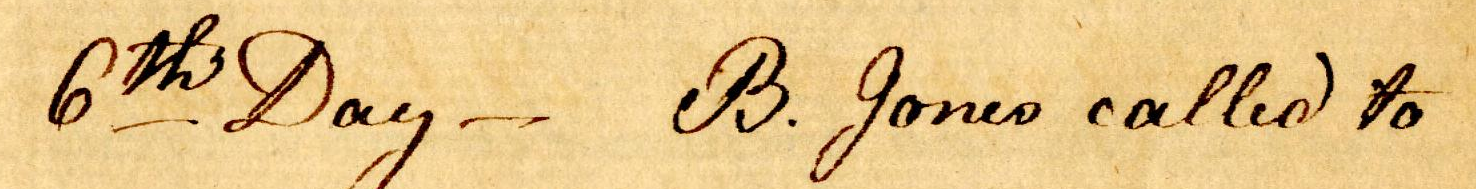6^th Day- B. Jones called to
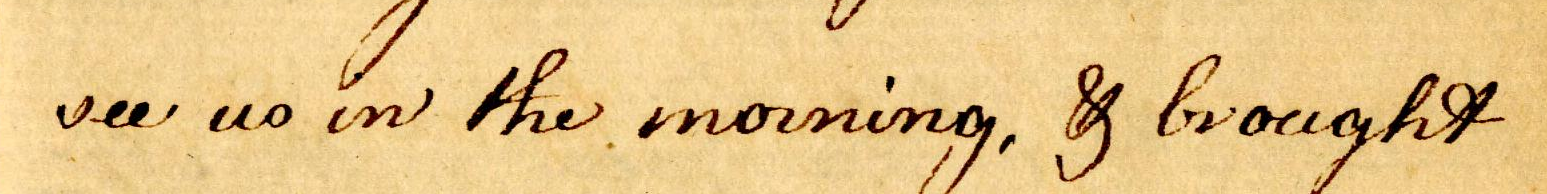see us in the morning, & brought
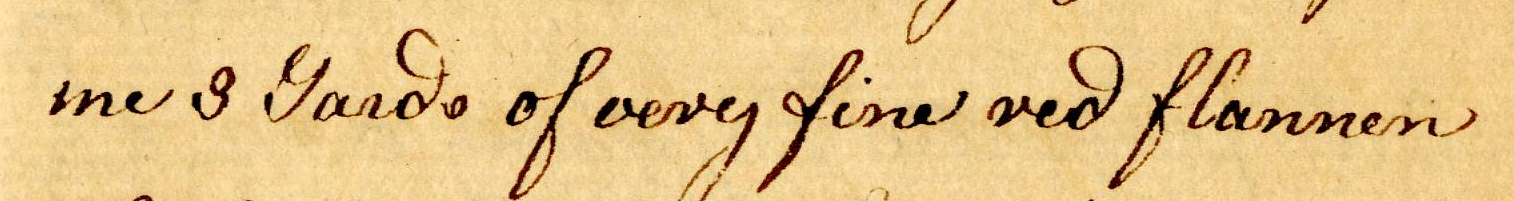me 3 Yards of very fine red flannen
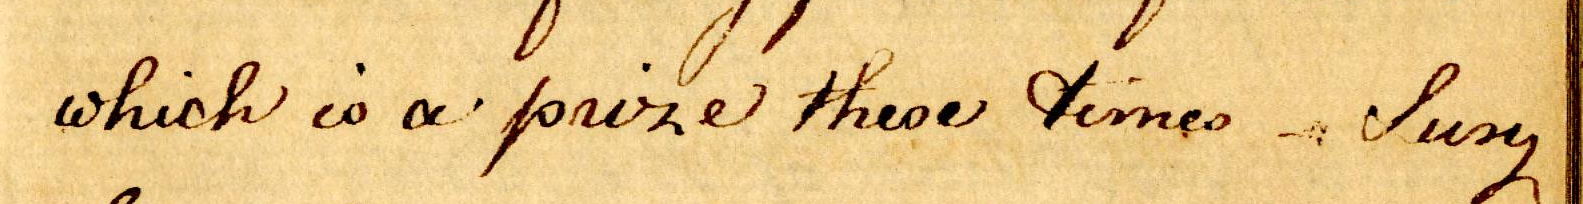which is a prize these times - Susy
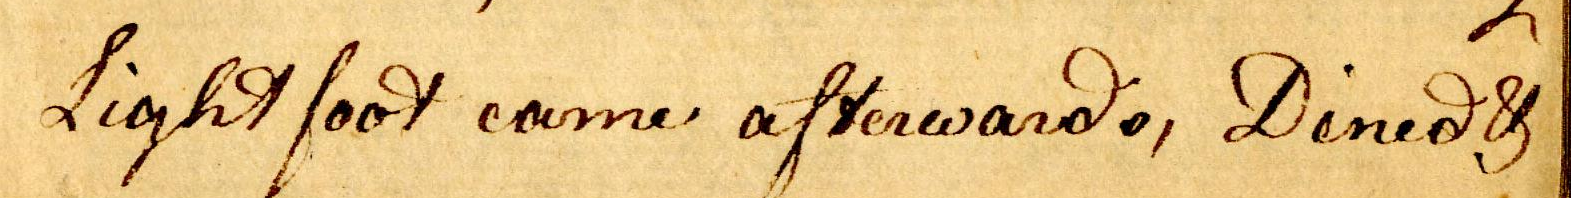Lightfoot came afterwards, Dined &
